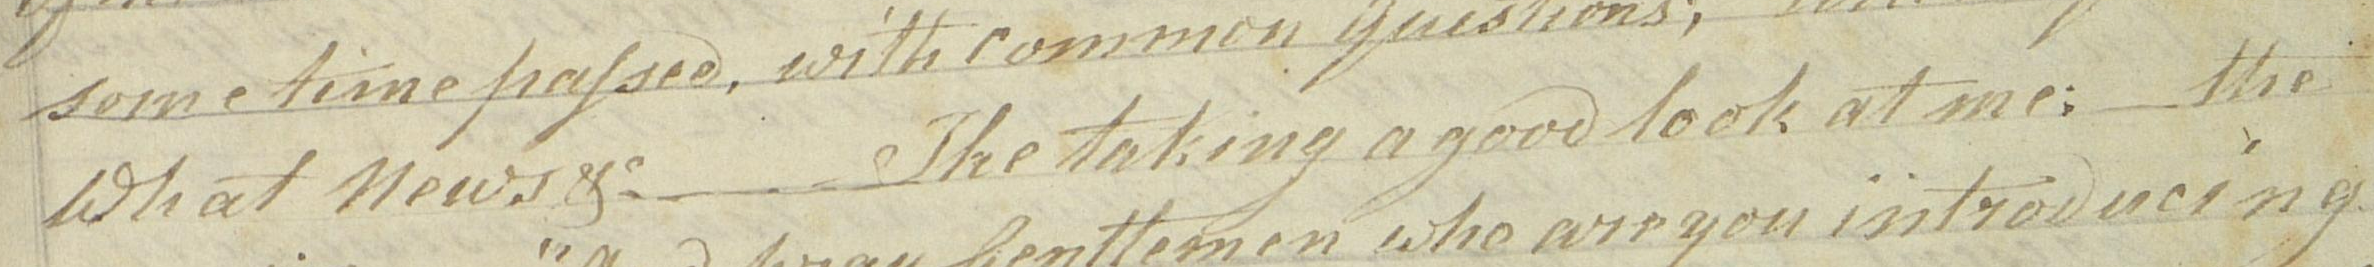What News &^ c The taking a good to look at me; the
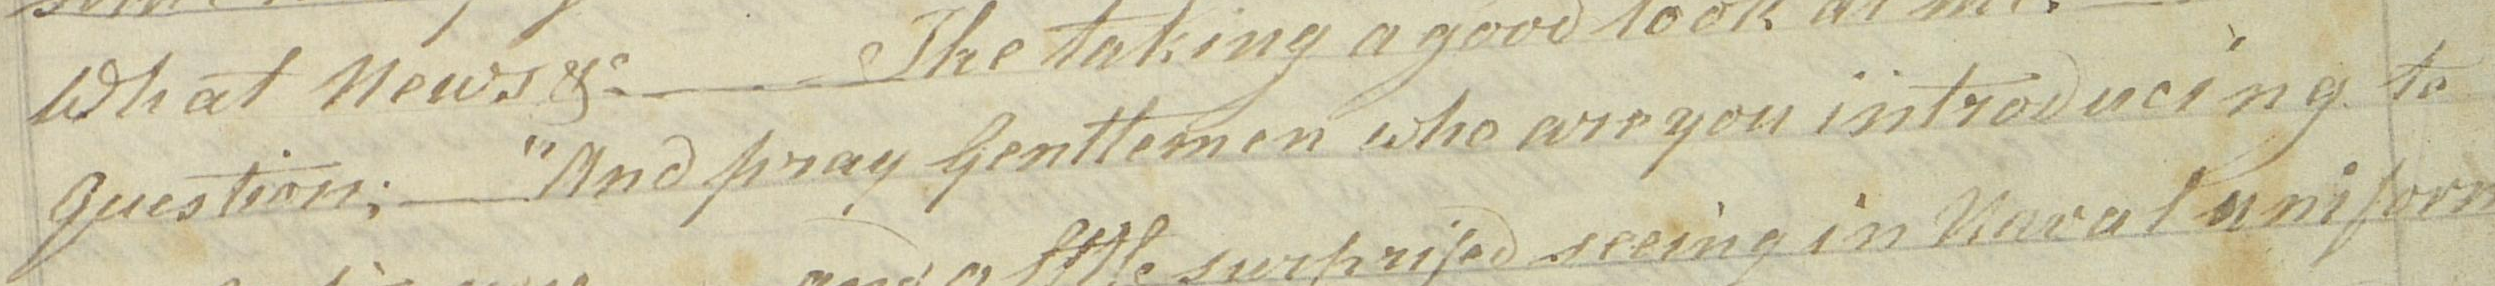question; "And pray Gentlemen who are you introducing to
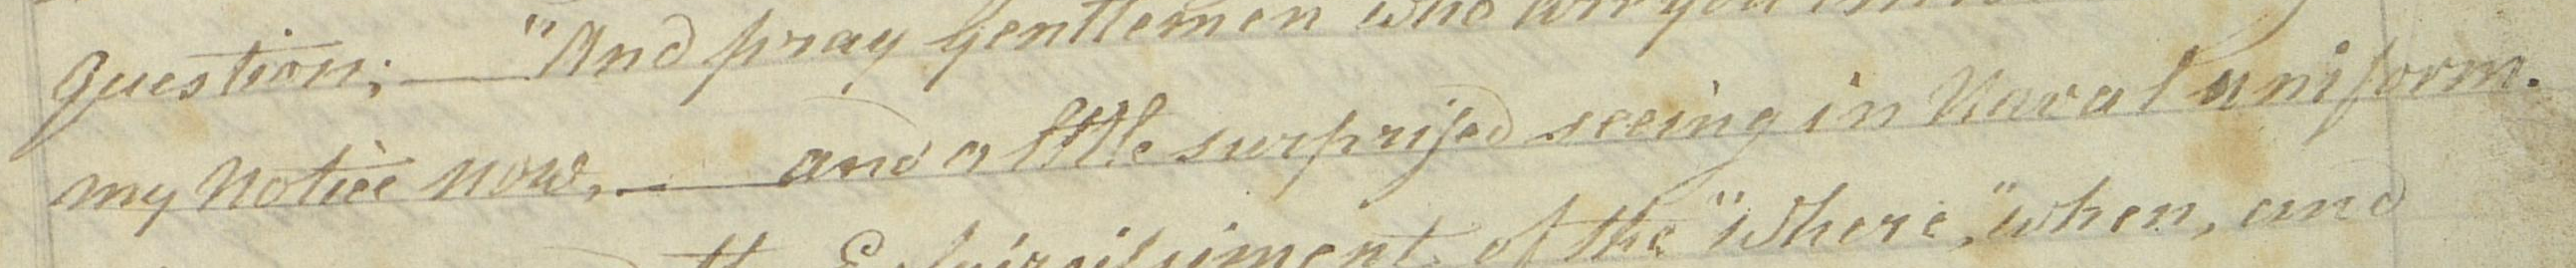my Notice now, and a lttle surprised seeing in Naval uniform.
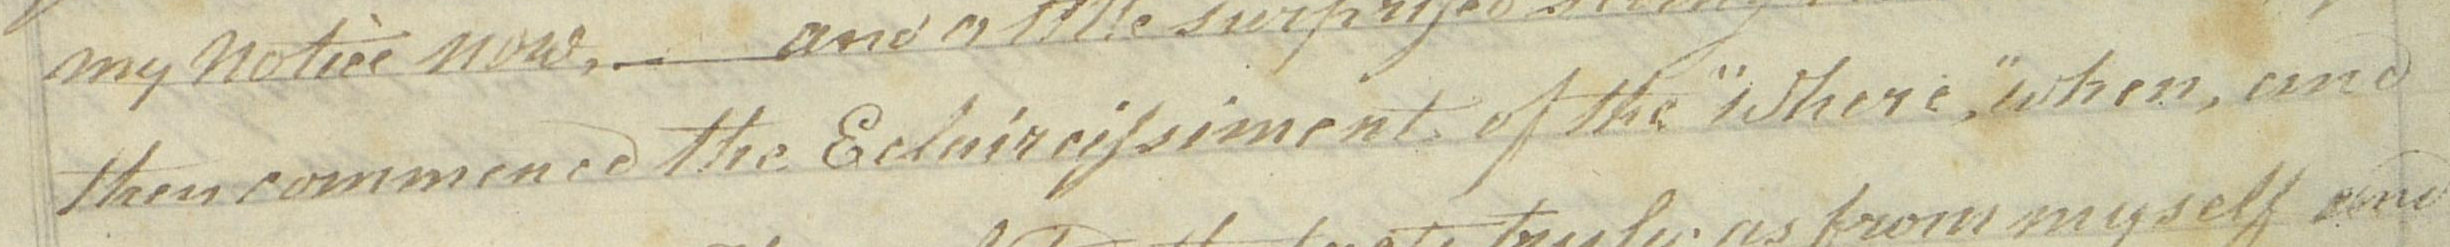then commencd the Eclaircissiment of the "where," when, and
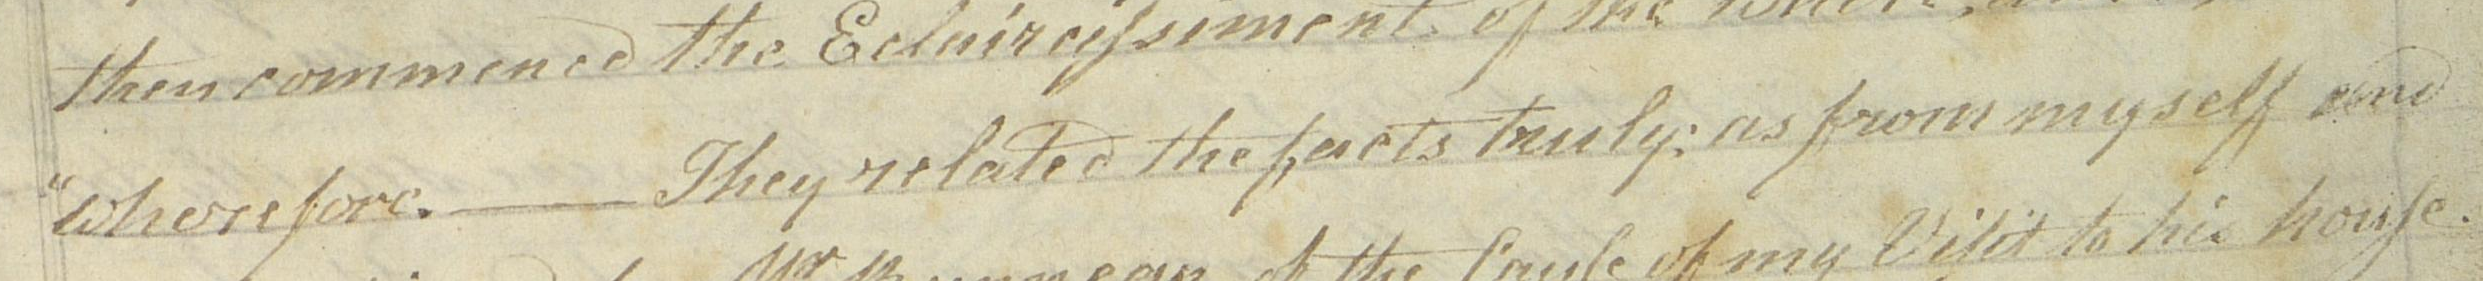"wherefore. They related the facts truly: as from myself and
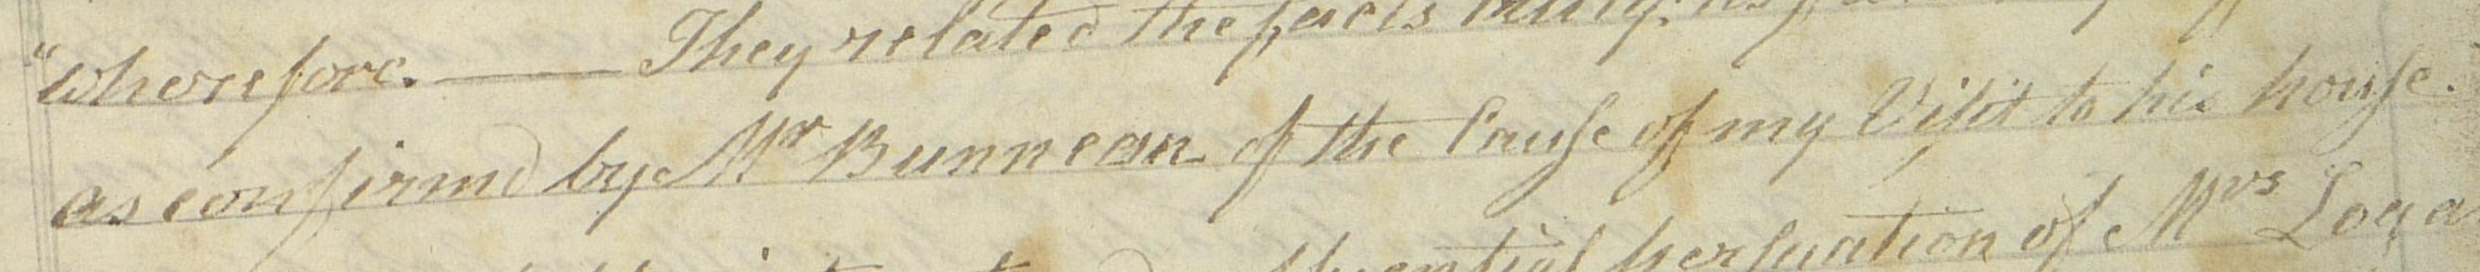as confirmd by M^r. Bunneau of the Cause of my Visit to his house.
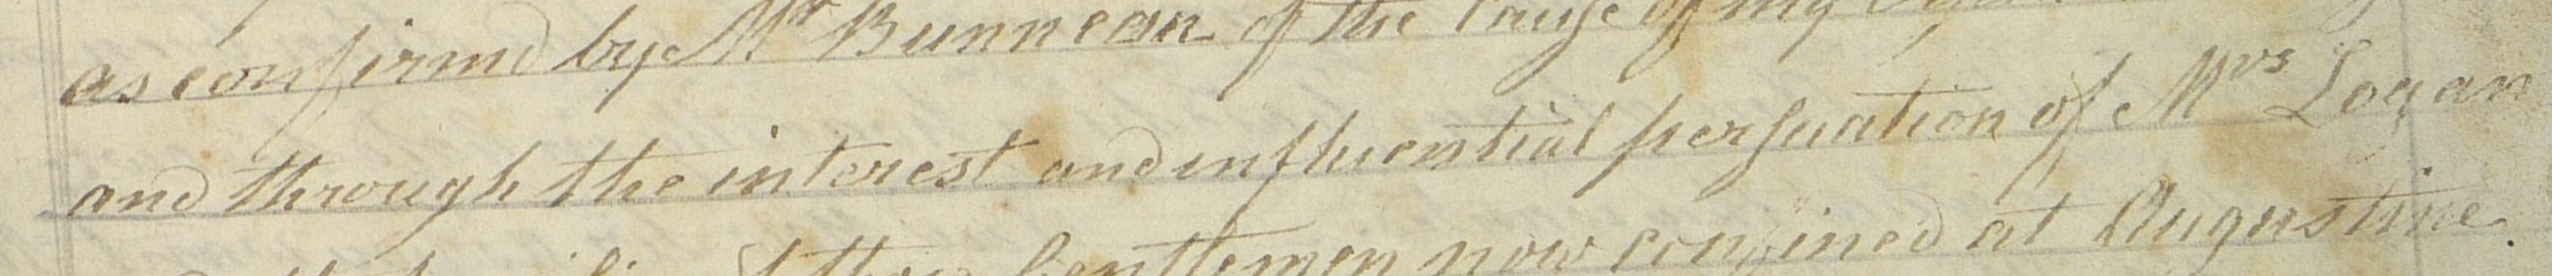and through the interest and influential persuation of M^rs Logan
